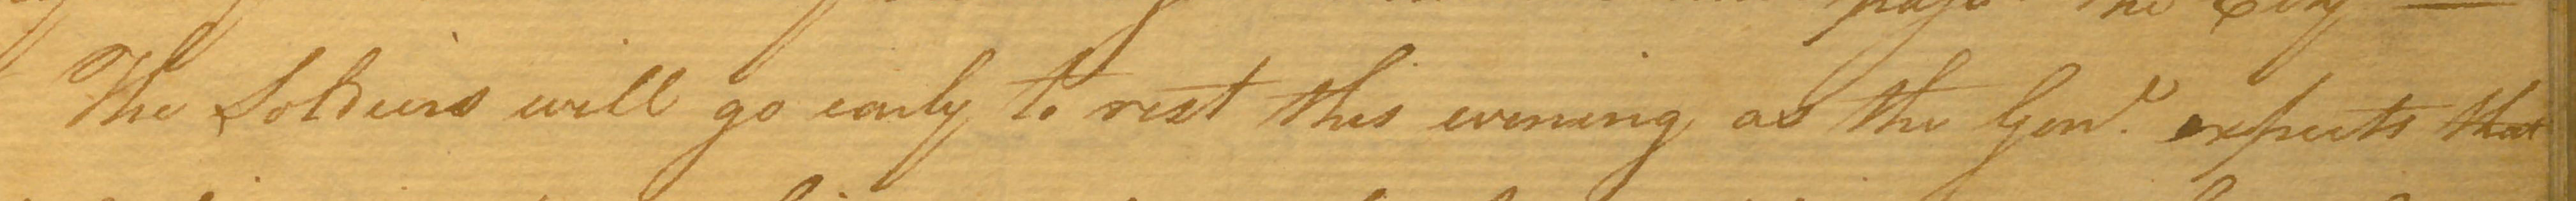The Soldiers will go early to rest this evening, as the Gen^l. expects that
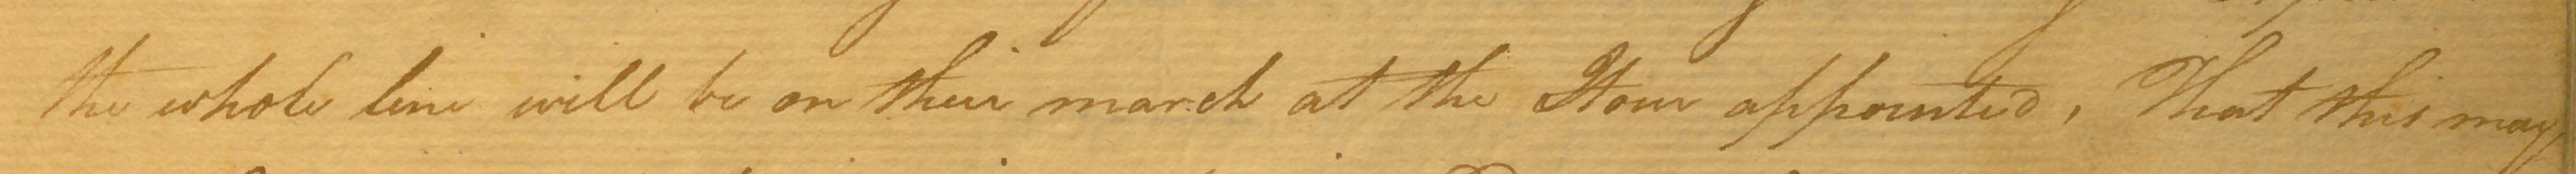the whole line will be on their march at the Hour appointed, That this may
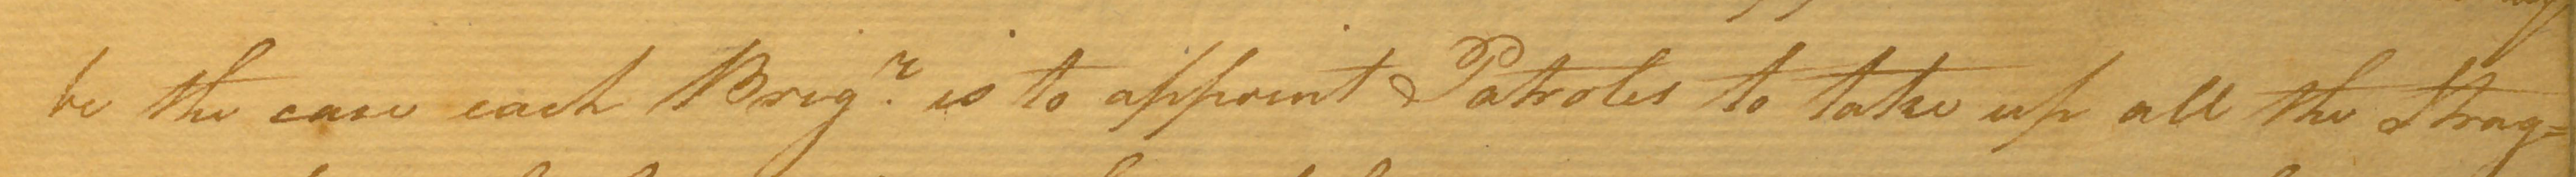be the case each Brig^r. is to appoint Patrols to take up all the Strag
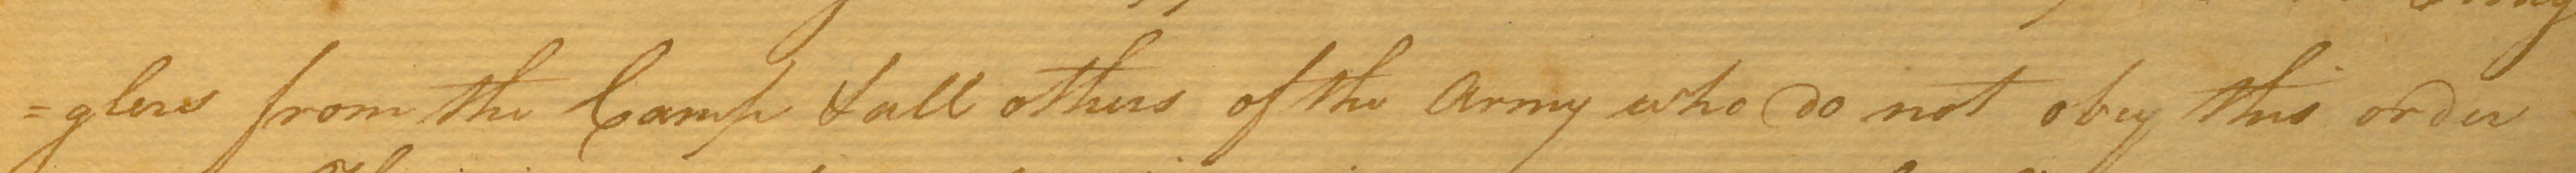-glers from the Camps & all others of the army who do not obey this order
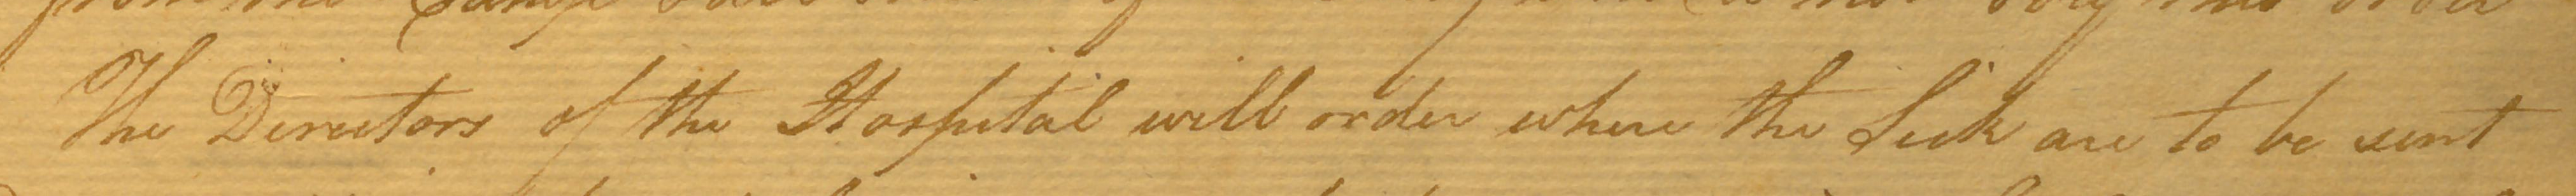The Directors of the Hospital will order where the Sick are to be sent
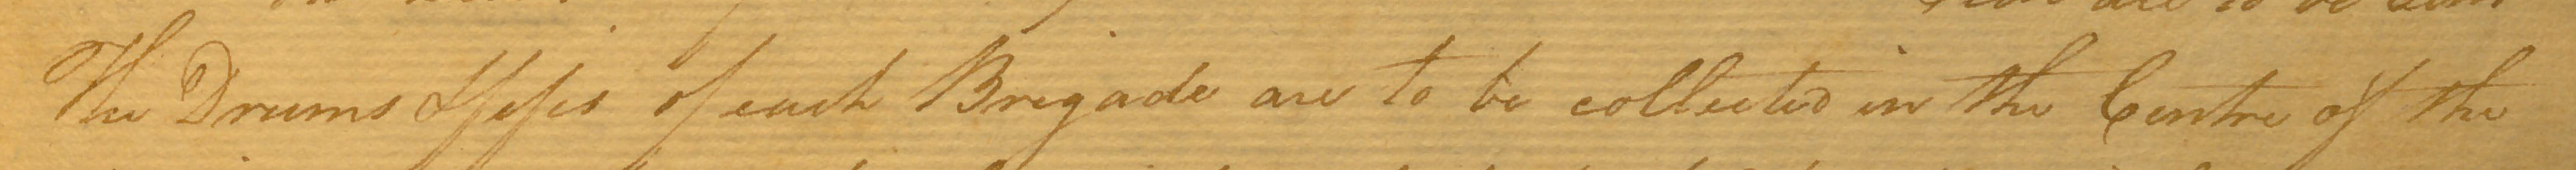The Drums & fifes of each Brigade are to be collected in the Centre of the
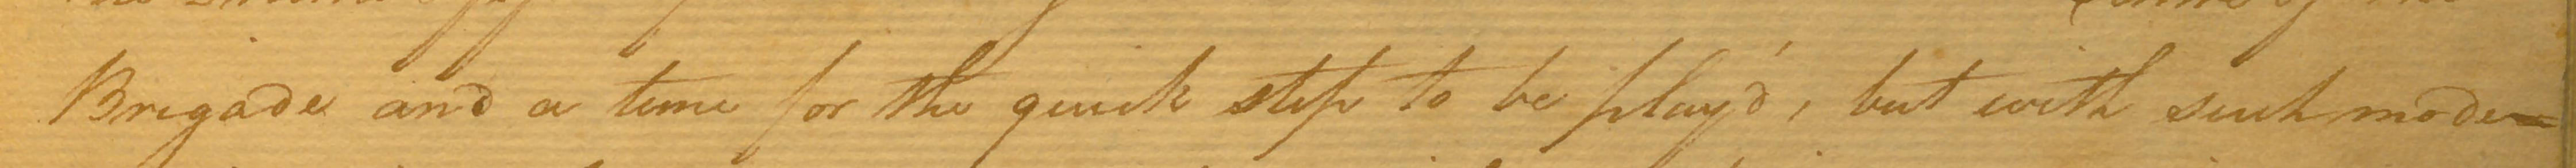Brigade and a time for the quick step to be play'd, but with such mode-
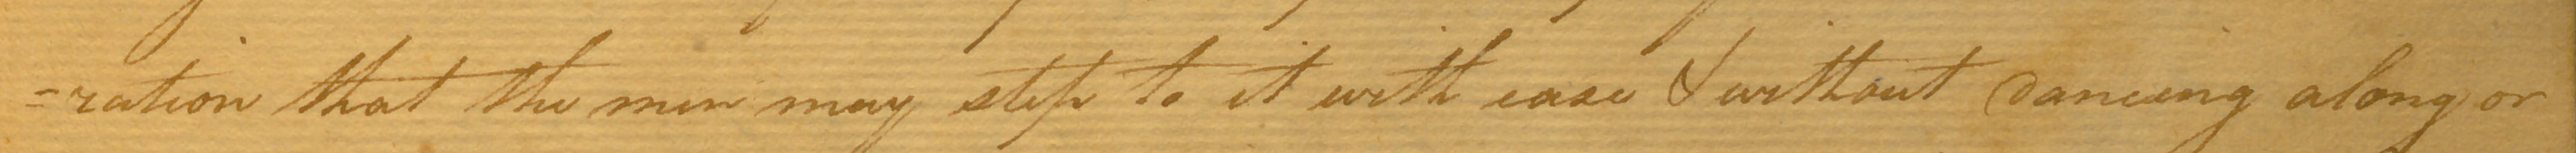-ration that the men may step to it with ease & without dancing along or
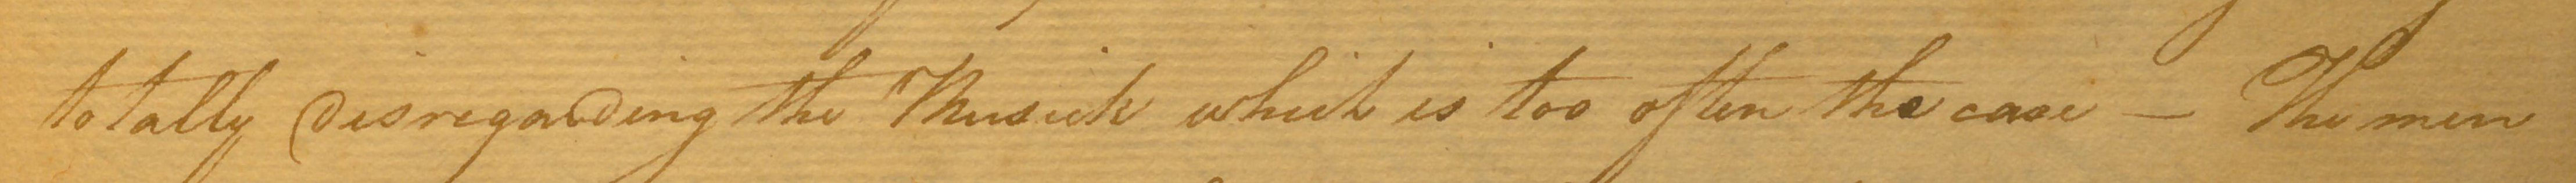totally disregarding the Musick which is too often the case- The men
